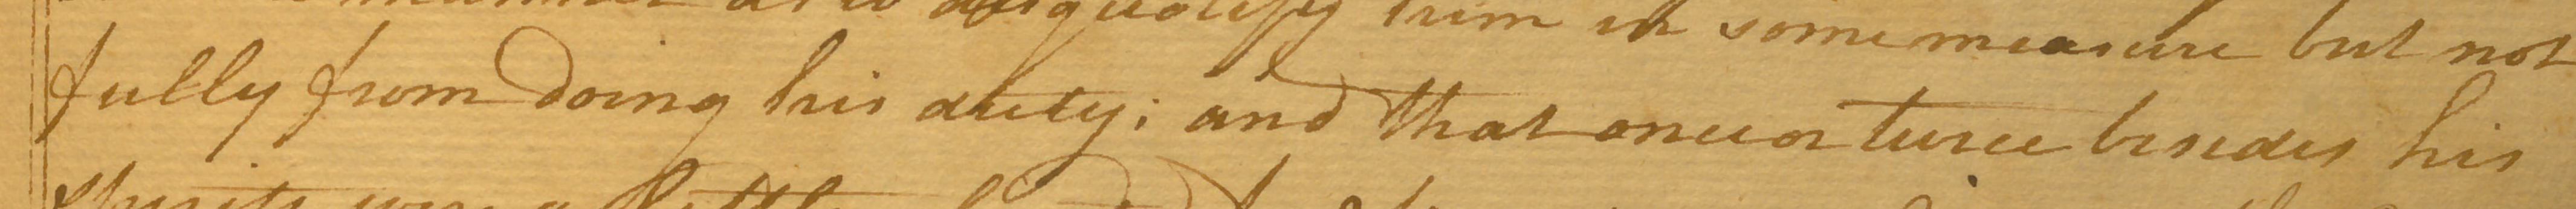fully from doing his duty; and that once or twice besides his
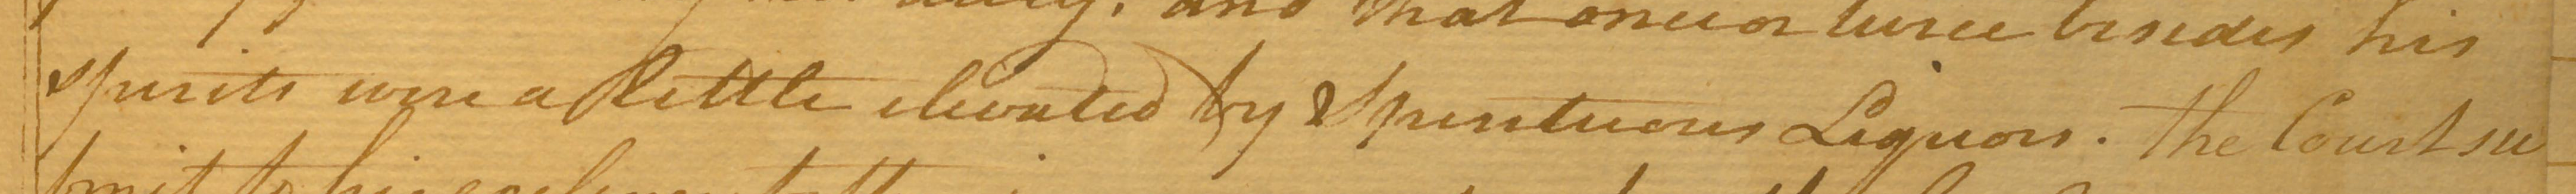spirits were a little clouded by spirituous Liquors. the Courts su
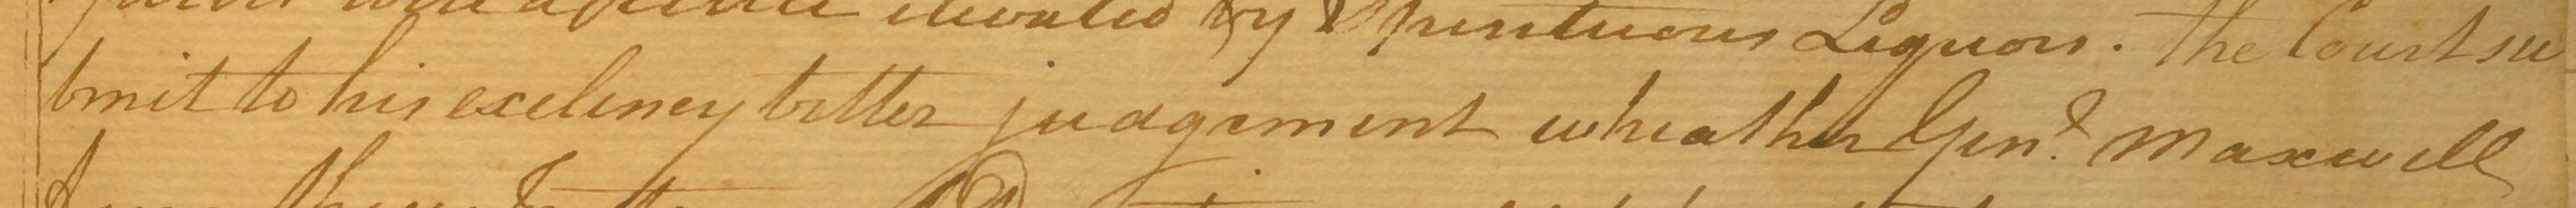bmit to his excelency better judgement wheather Gen^l. Maxwell
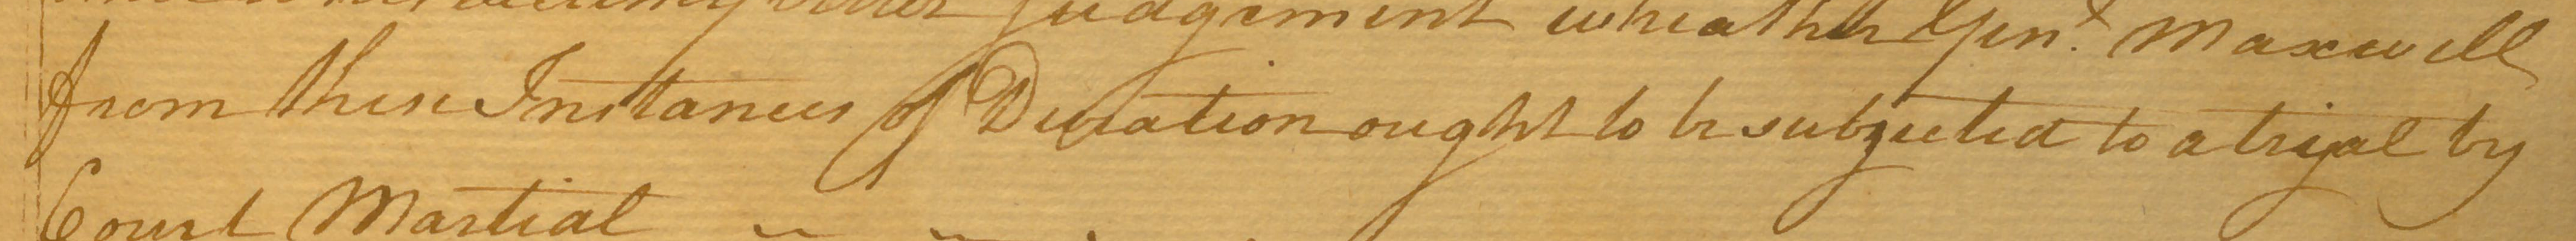from these Instances of Duration ought to be subjected to a tryal by
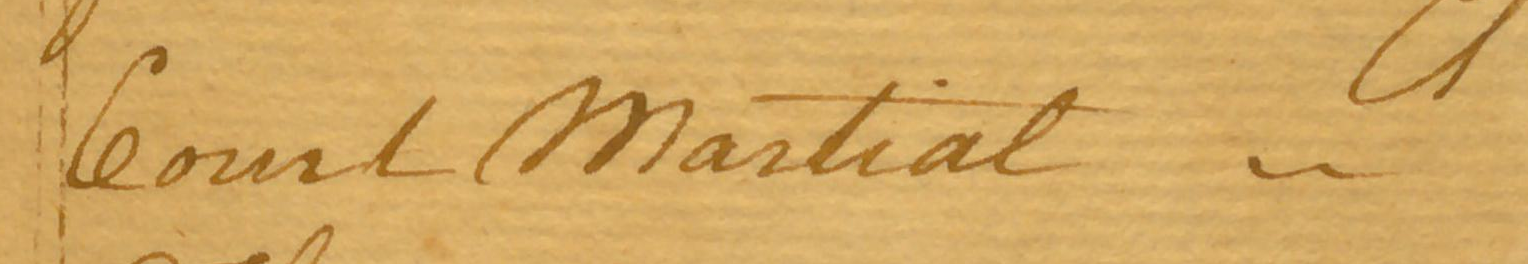Court Martial-
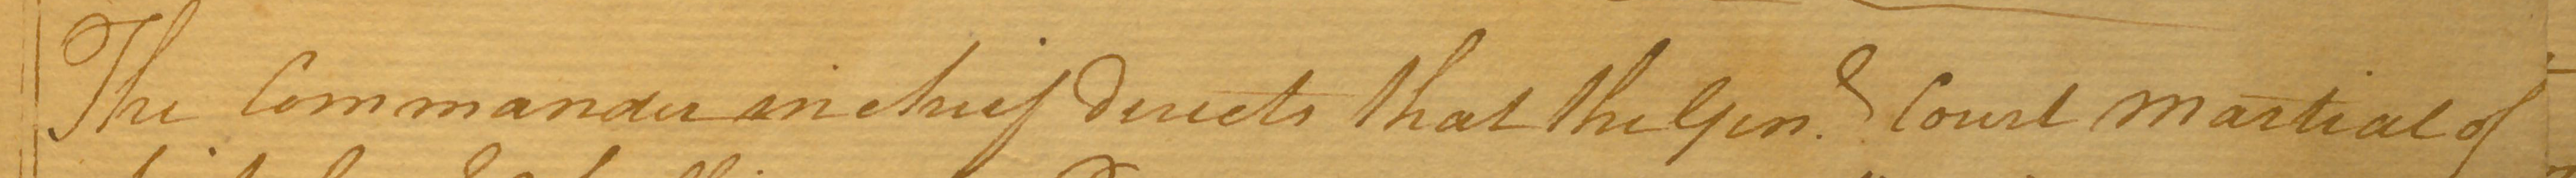The Commander in chief directs that the Gen^l. Court martial of
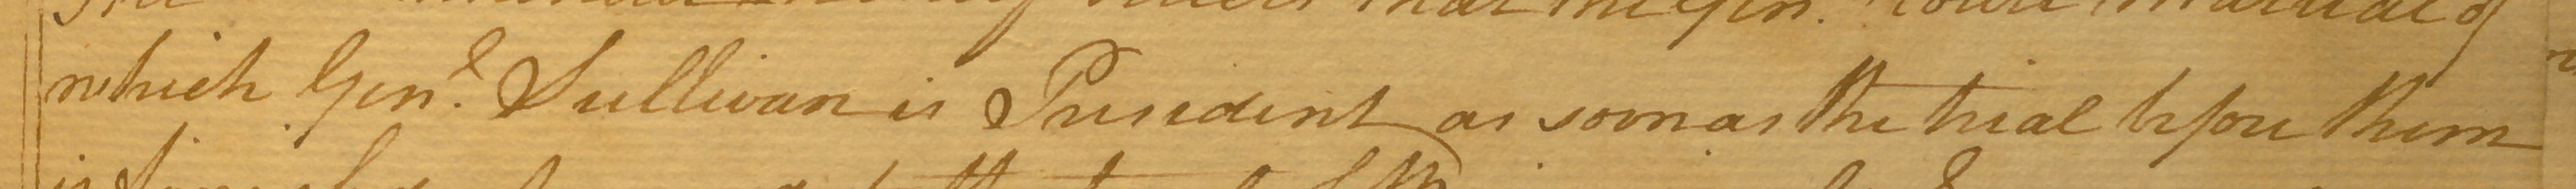which Gen^l. Sullivan is President as soon as the trial before them
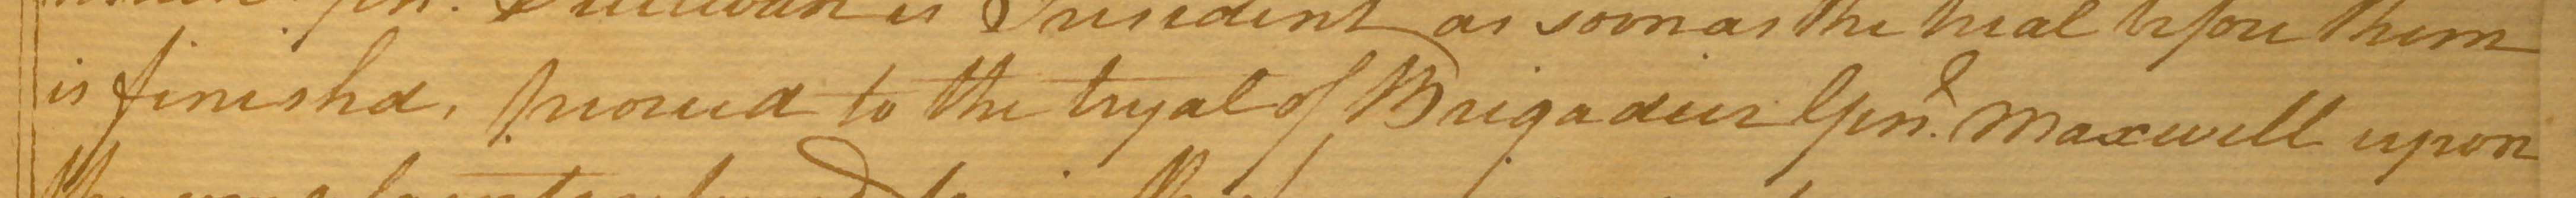is finishd, proceed to the tryal of Brigadier Gen^l. Maxwell upon
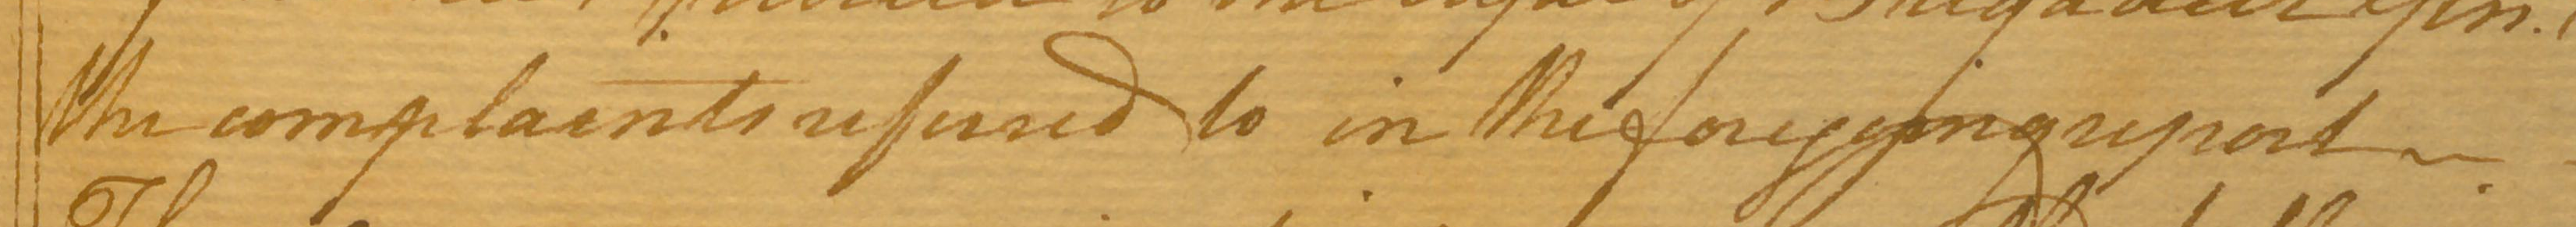the complaints referred to in the foregoing report-
